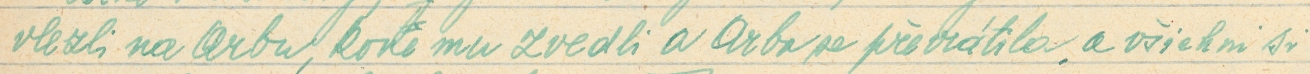vlezli na Arbu, koně mu zvedli a Arba se převrátila a všichni si
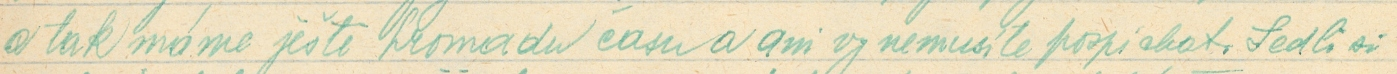a tak máme ještě hromadu času a ani vy nemusíte pospíchat. Sedli si
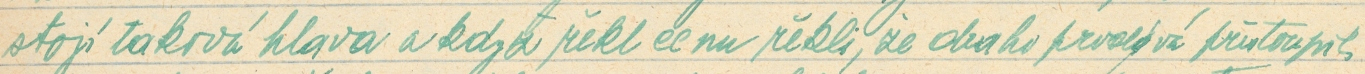stojí taková hlava a když řekl cenu řekli, že draho prodává přestoupili
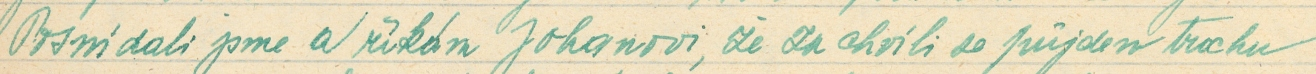Posnídali jsme a říkám Johanovi, že za chvíli se půjdem trochu
